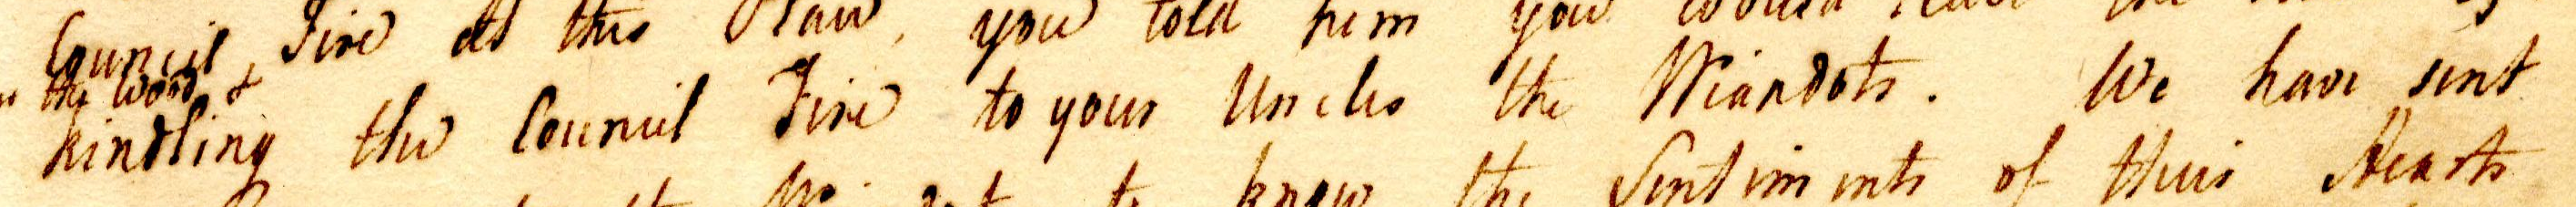^ kindling the Council Fire to your Uncles the Wiandots. We have sent
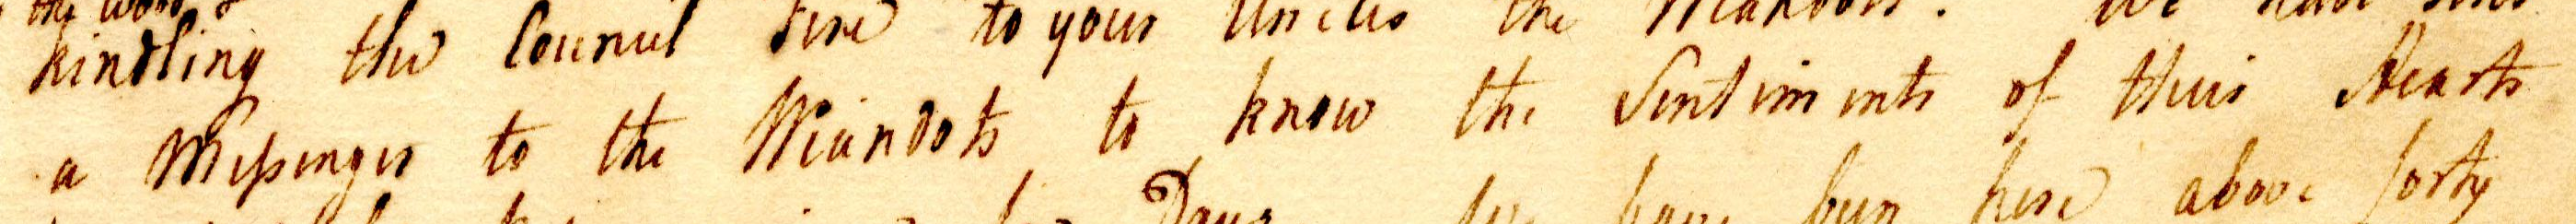a Messenger to the Wiandots to know the Sentiments of their Hearts
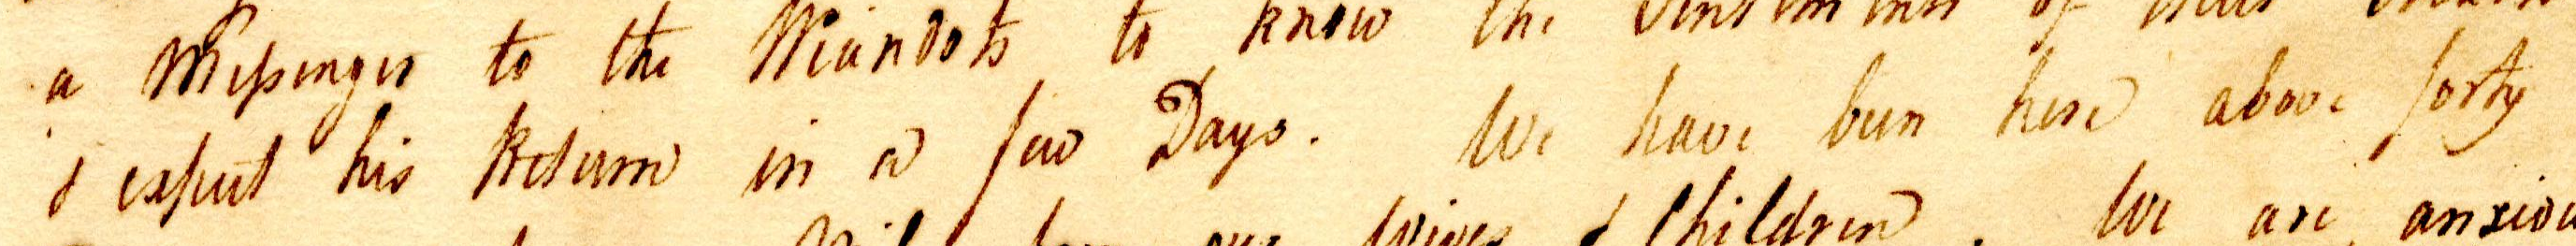& expect his Return in a few Days. We have been here above forty
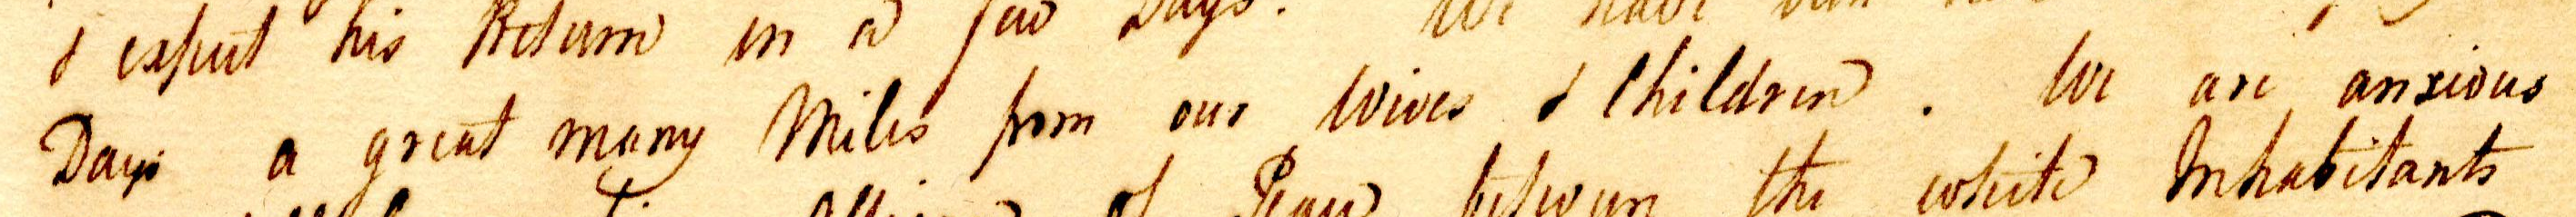Days a great many miles from our Wives & Children. We are anxious
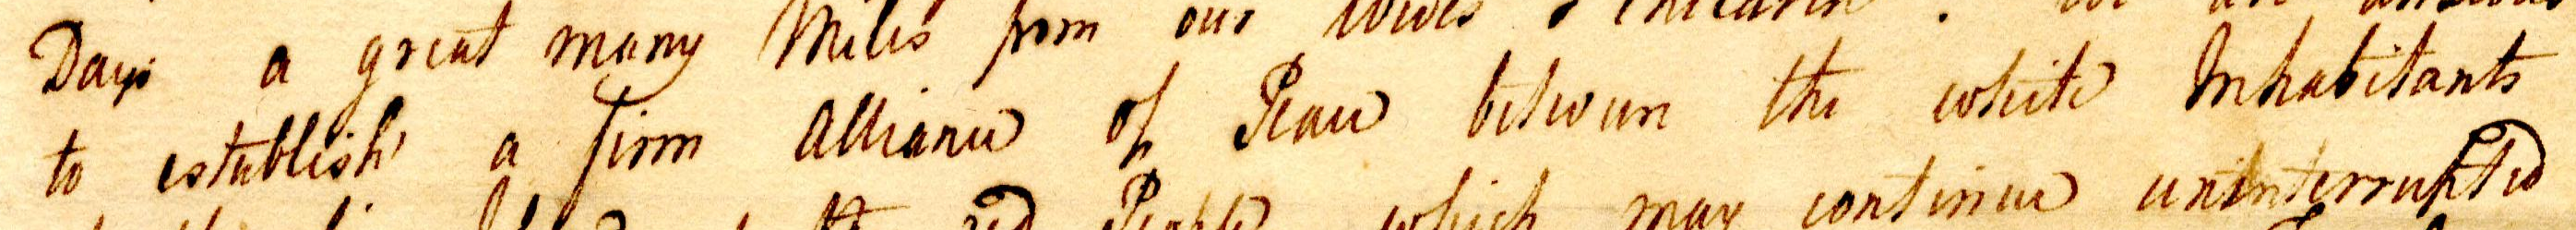to establish a firm Alliance of Peace between the white Inhabitants
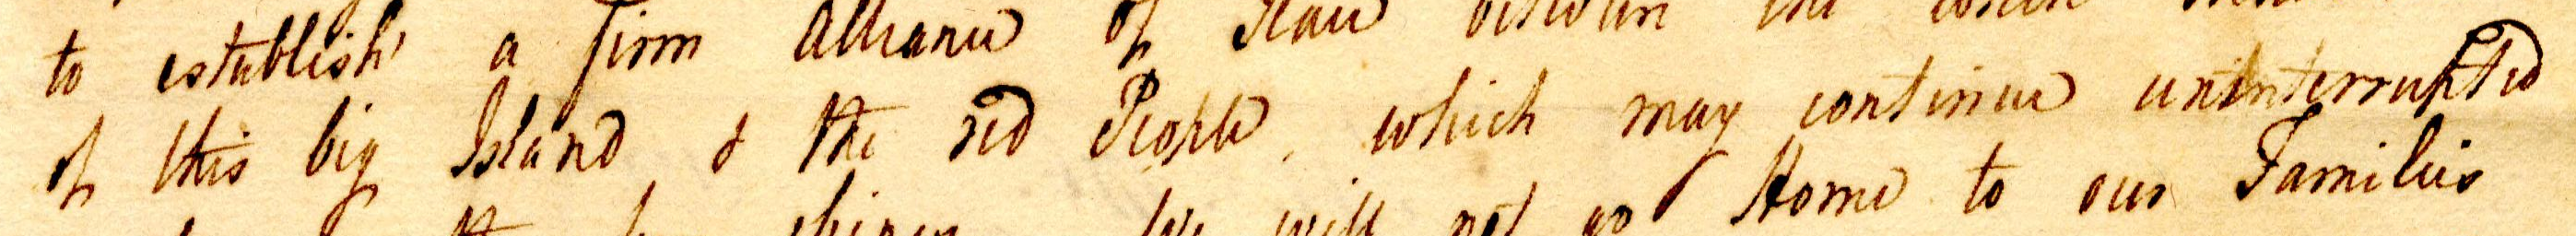of this big Island & the red People which may continue uninterrupted
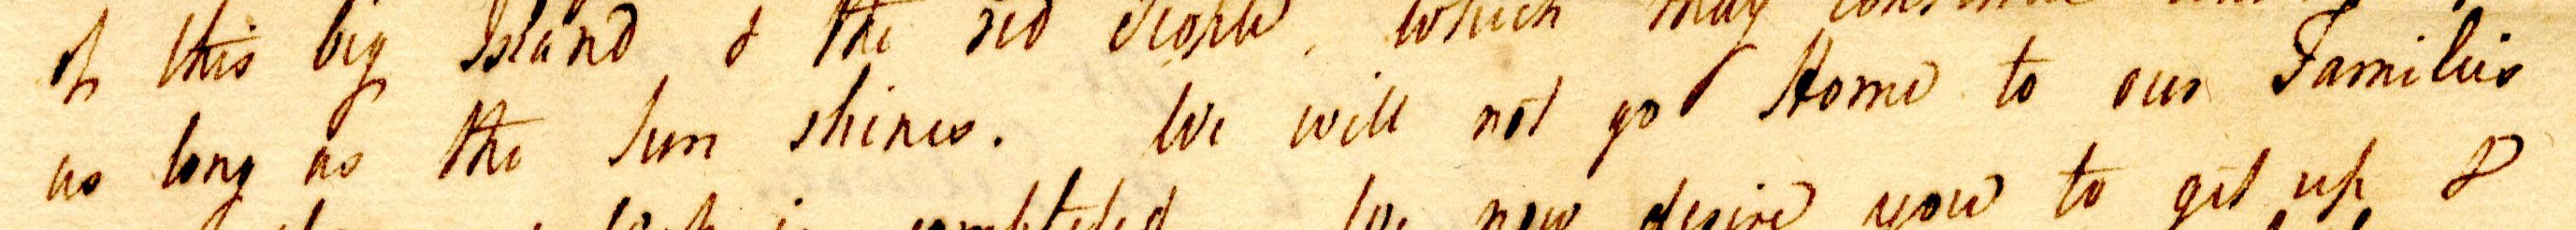as long as the sun shines. We will not go Home to our Families
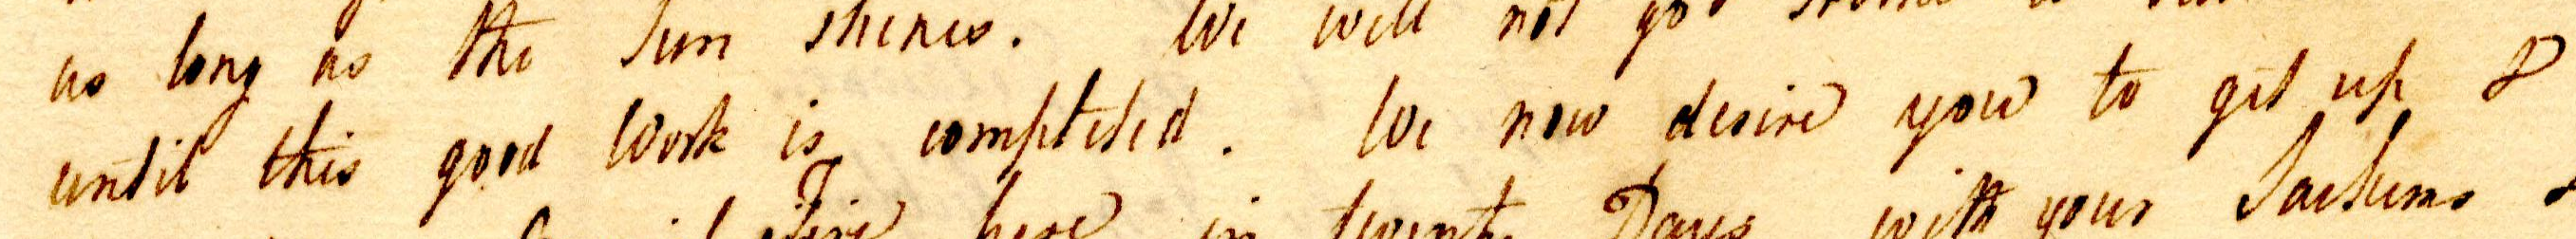until this good work is completed. We now desire you to get up &
